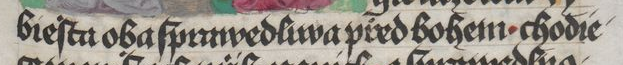bíeẛta oba ſprawedliwa pṙed bohem.chodíe-
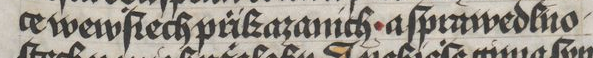ce wewẛíech pṙikazanich.a ſprawedlno¬
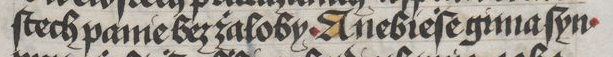ſtech panie bez żaloby.A nebieẛe gima ſyn.
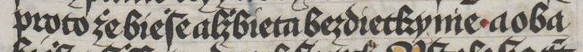proto że bíeẛe alżbieta bezdietkynie.a oba¬
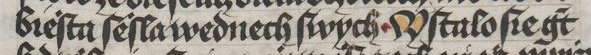bíeẛti ſeẛla wednech ſwých.Yſtaloſie ḡt
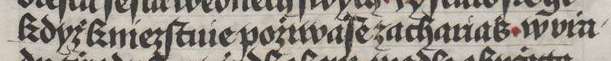kdýž kniezſtuie pożiwaẛe zachariaṡ.w vṙa¬
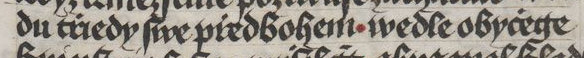du tṙiedy ſwe pṙedbohem.wedle obyċege
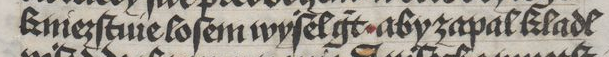kníezſtuie loſem wyẛel ḡt.aby zapal kladl
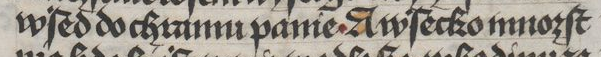wẛed do chramu panie.A wẛecko mnozſt¬
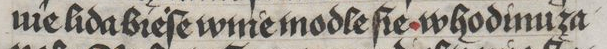uie lida bíeẛe wnie modle ſie.whodinu za¬
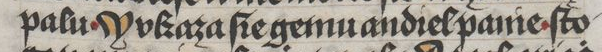palu.Yvkaza ſie gemu andiel panie.ſto¬
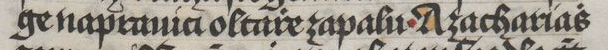ge napraúící oltaṙe aapalu.A zachariaṡ
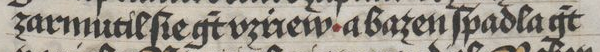zarnutil ſie ḡt vzṙiew.a bazen ſpadla ḡt
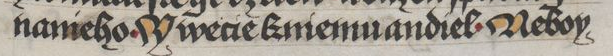nanieho.Y wecie kniemu andiel.Neboy
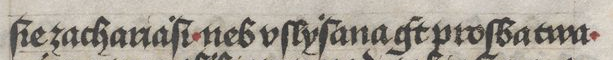ſie zachariaẛi.neb vſlyẛana ḡt proſba twa.
